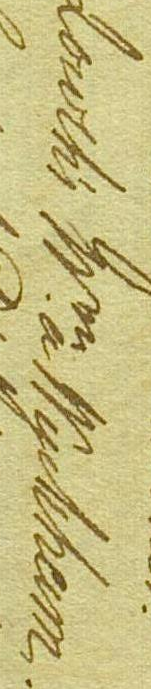Lowth's W^m.a Wyckham.
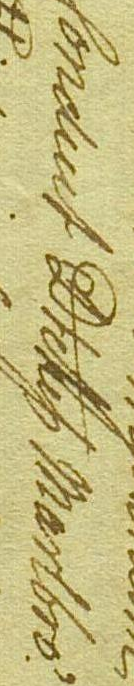Conduct Duchess Marlbro'.
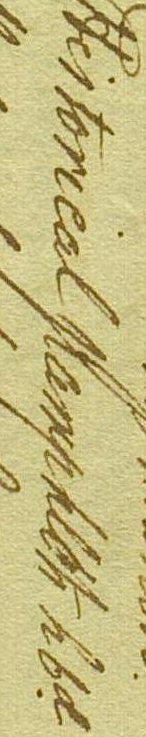Historical pamphlets h6^d.
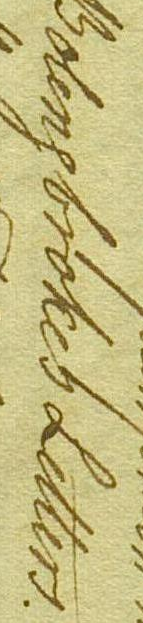Bolingbrokes Letters.
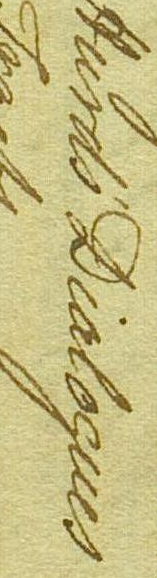Hurd's Dialogues
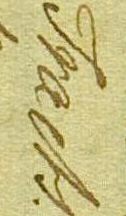Tracts.
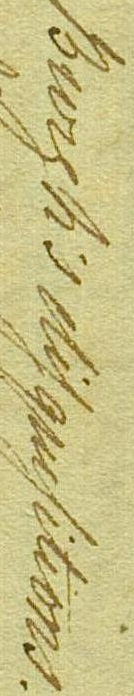Burgh's disquisitions.
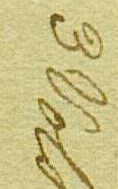3 Vols
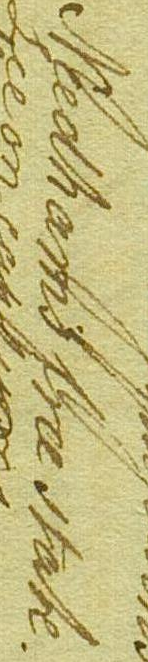Needham's free state.
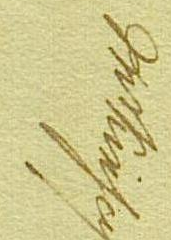M^r Kinsey
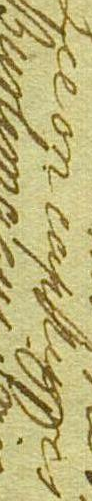Lee on captures
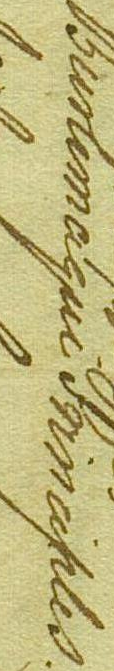Burlimaqui Principles.
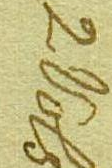2 Vols
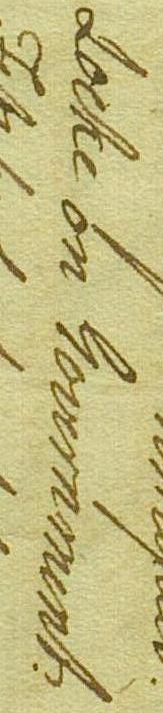Locke on Government.
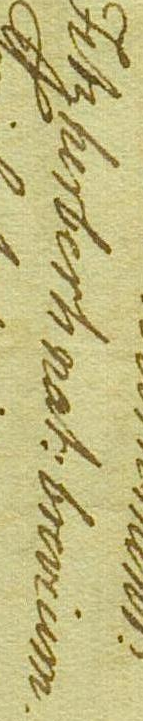Fitzherbert nat: brevium.
